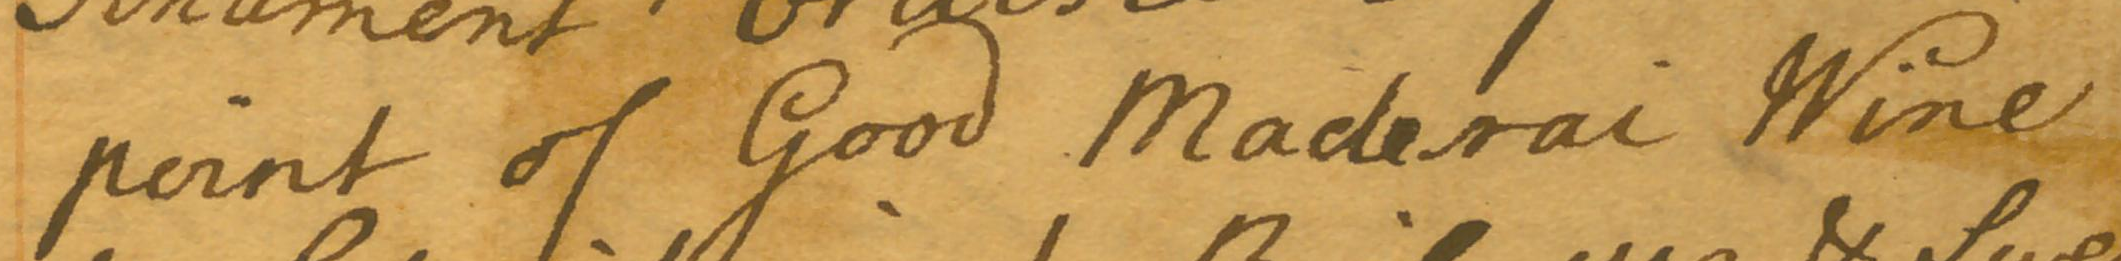peint of Good Maderai Wine
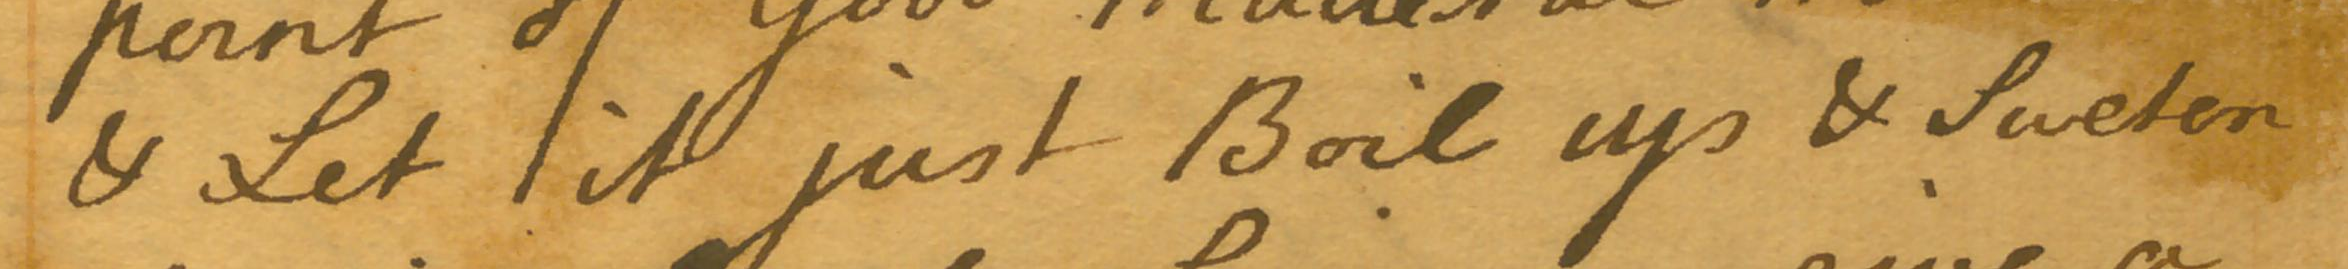& Let it just Boil up & Sweten
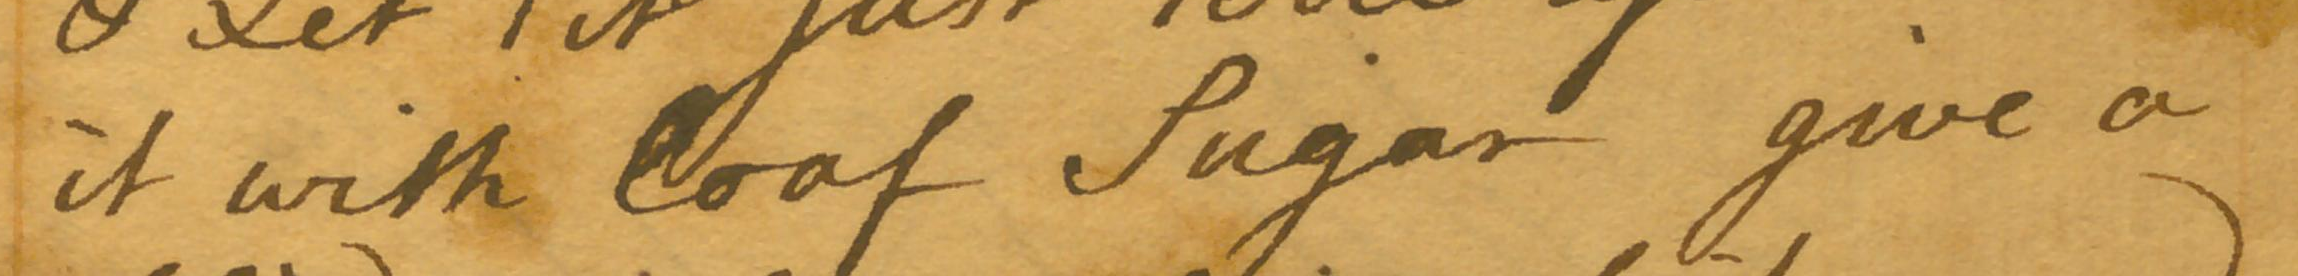it with loaf sugar give a
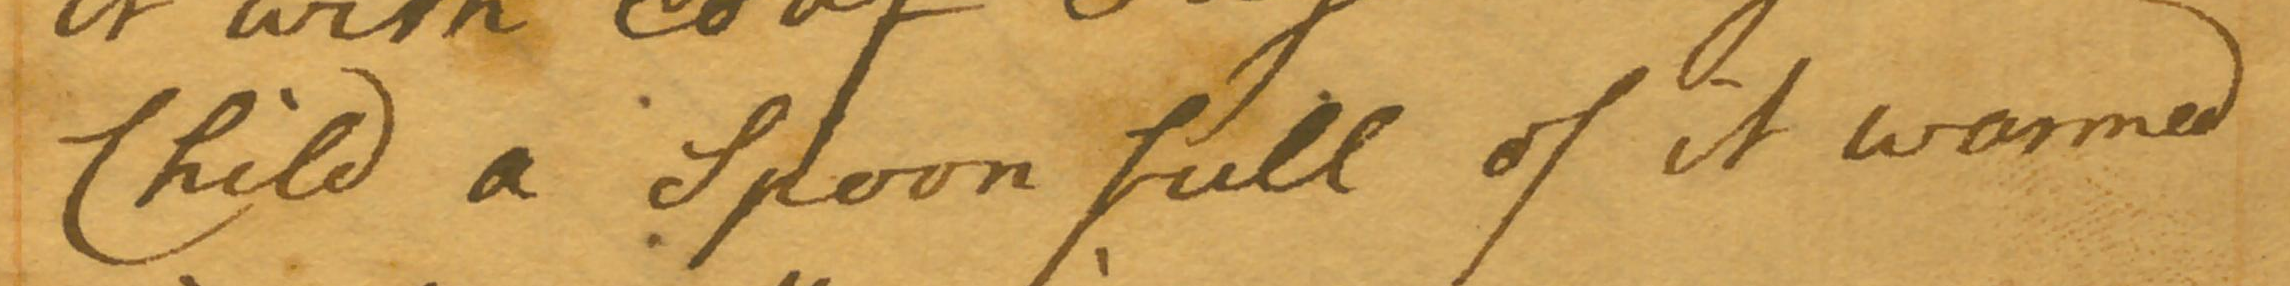Child a spoon full of it warmed
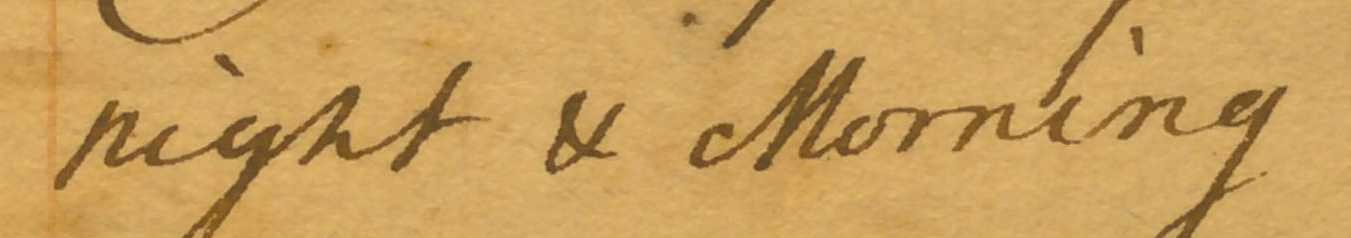night & Morning
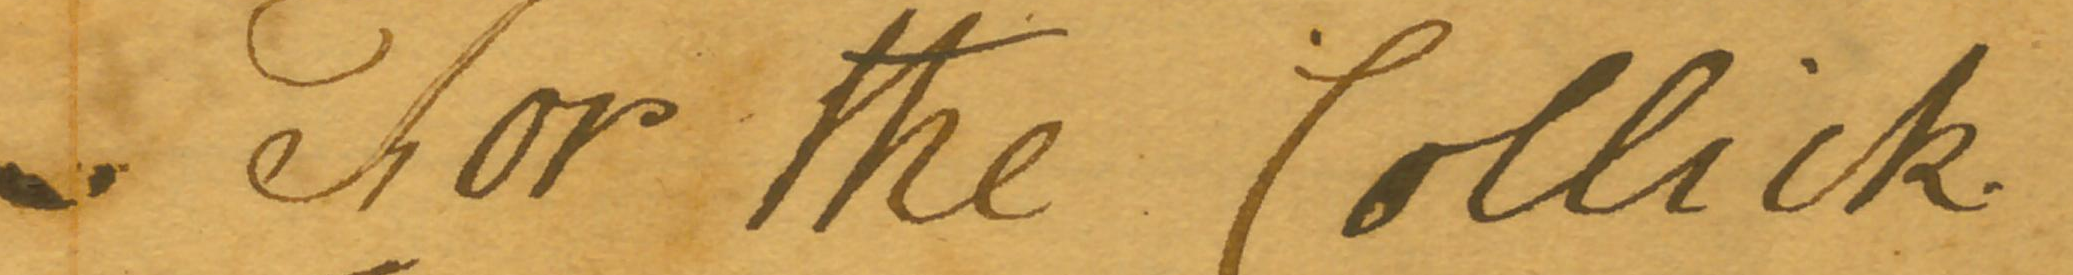For the Collick
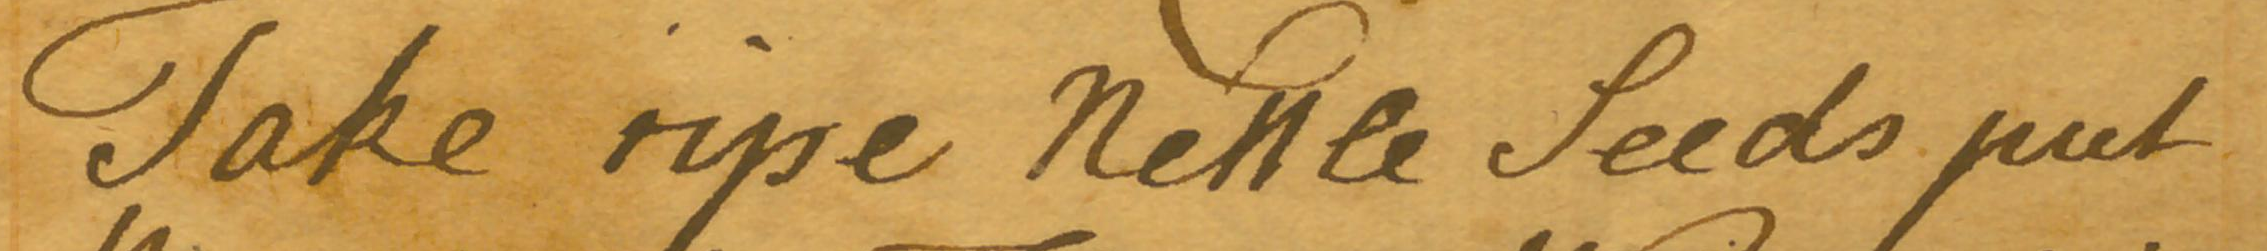Take ripe Nettle seeds put
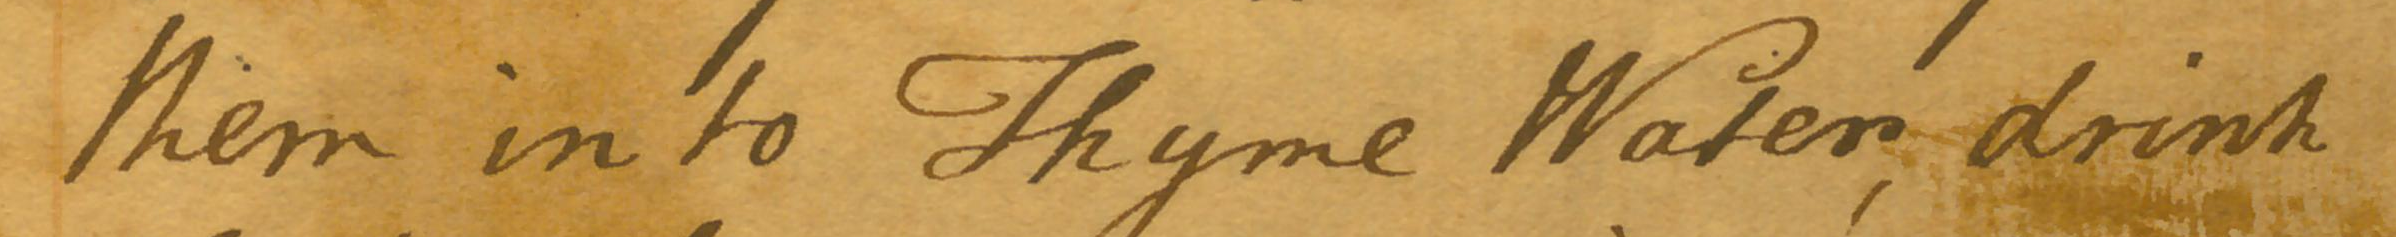them in to Thyme Water drink
